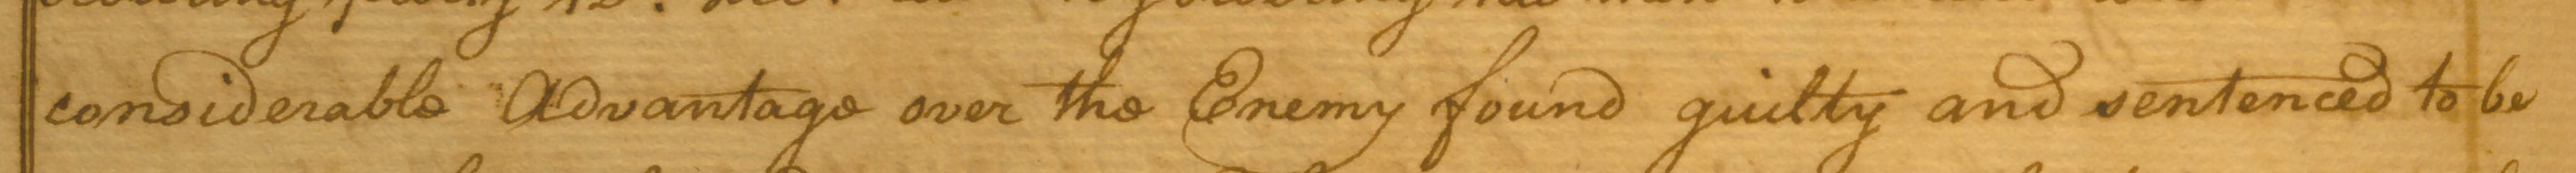considerable Advantage over the Enemy found guilty and sentenced to be
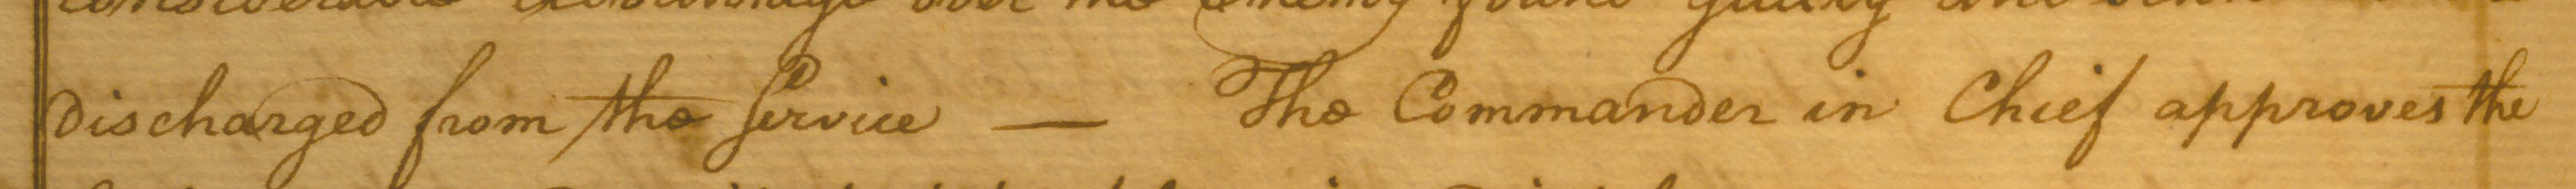discharged from the service- The Commander in Chief approves the
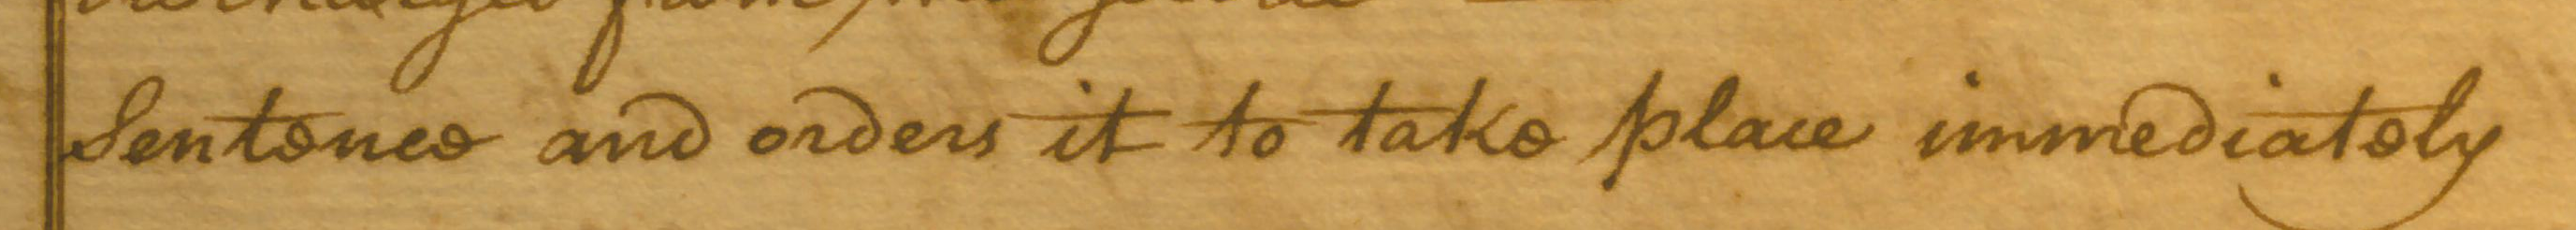Sentence and orders it to take place immediately
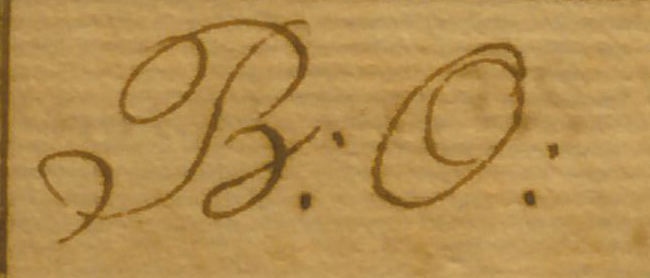B: O:
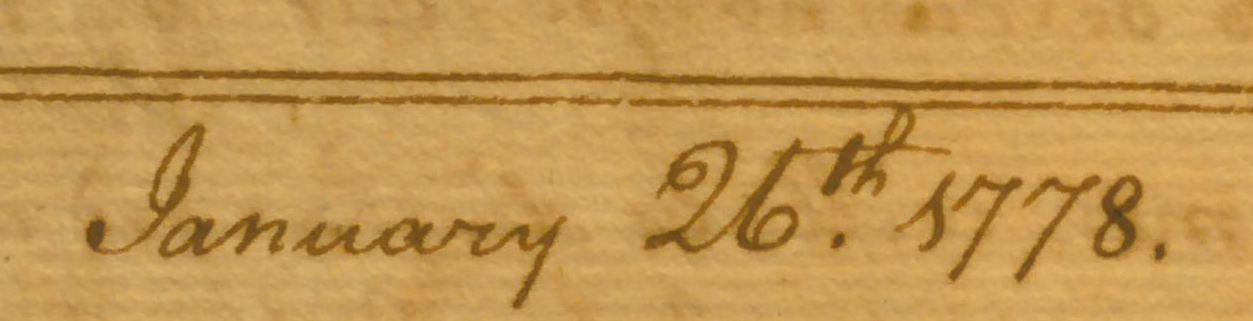January 26^th. 1778.
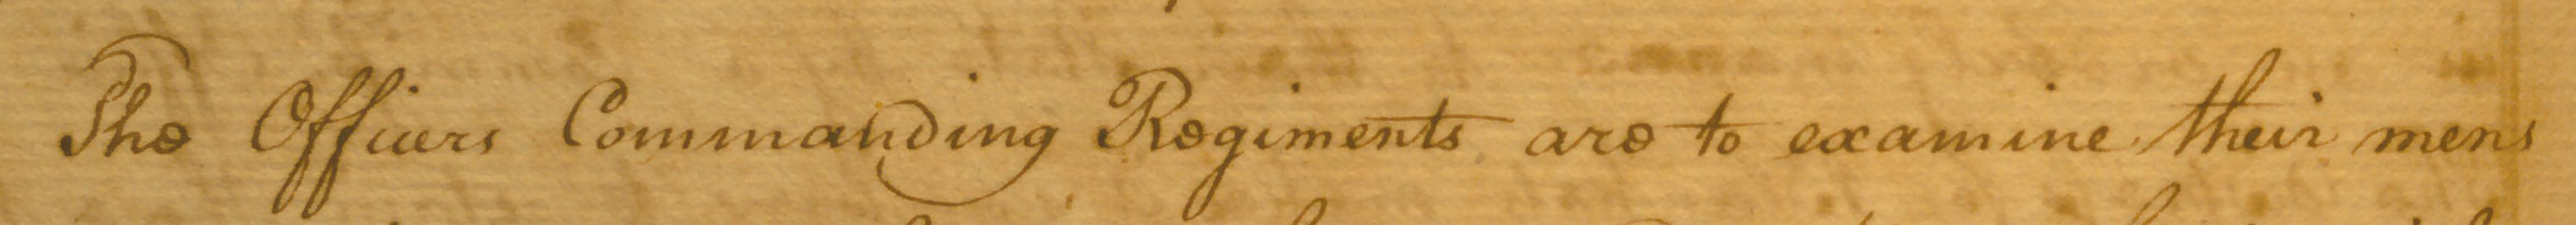The Officers Commanding Regiments are to examine their mens
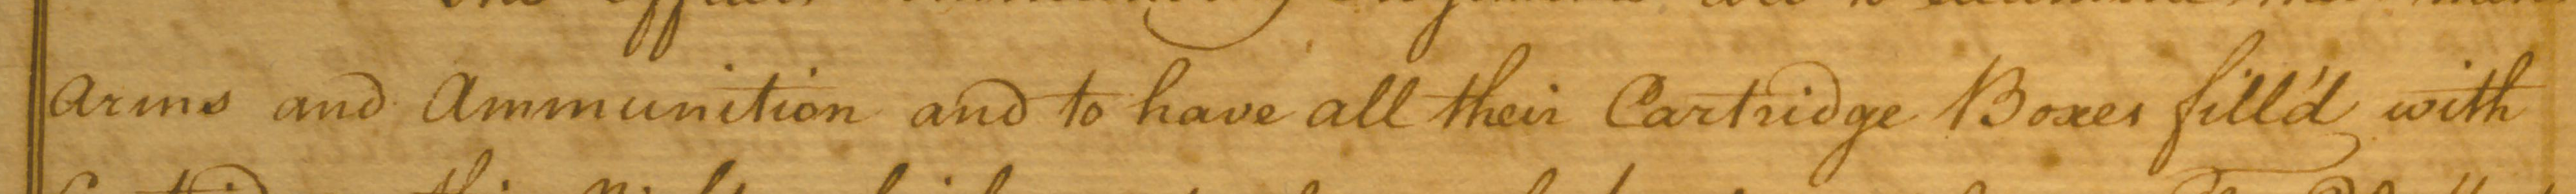Arms and Ammunition and to have all their Cartridge Boxes fill'd with
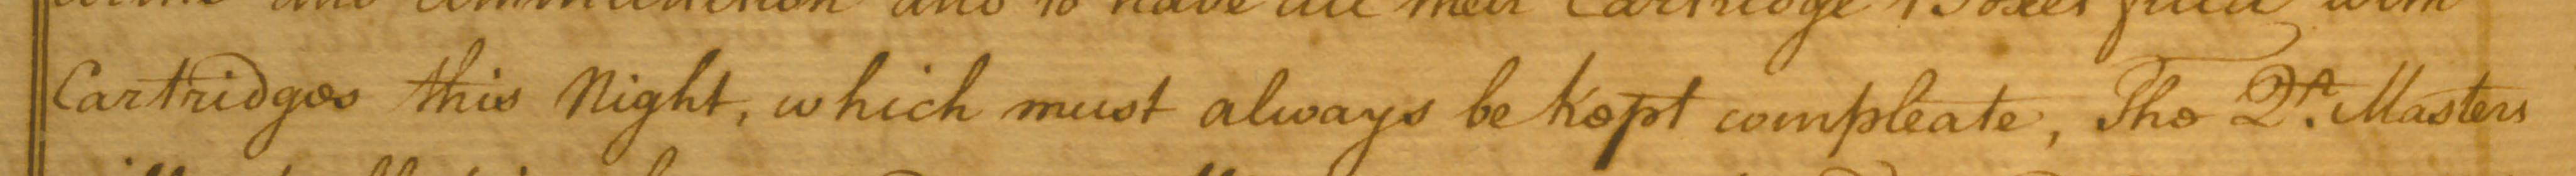Cartridges this Night, which must always be kept compleate. The Q^r. Masters
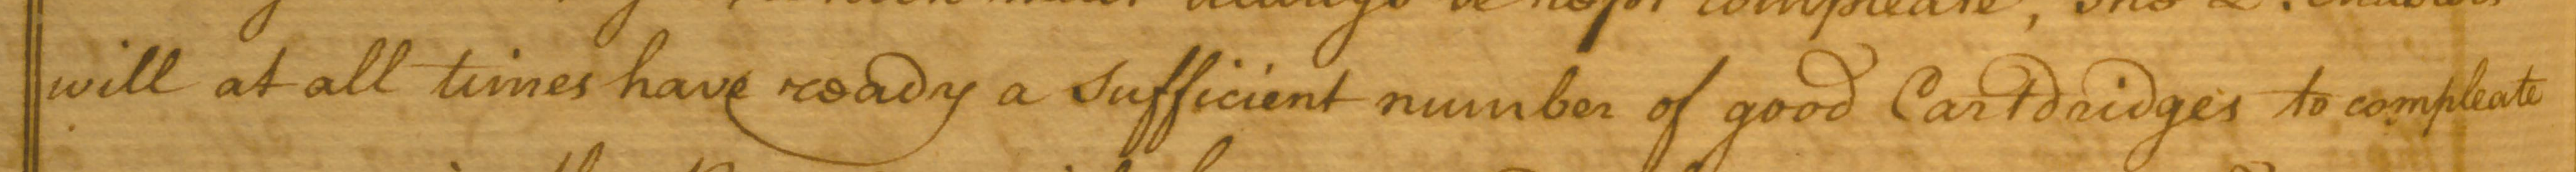will at all times have ready a sufficient number of good Cartridges to compleate
